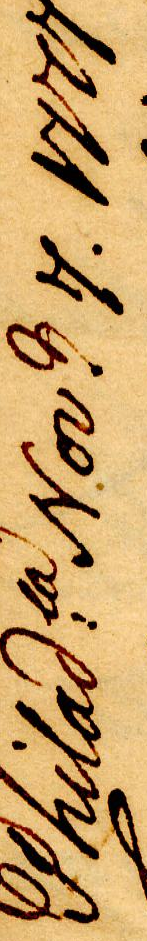Philad^ia: Nov^r. 7. 1777
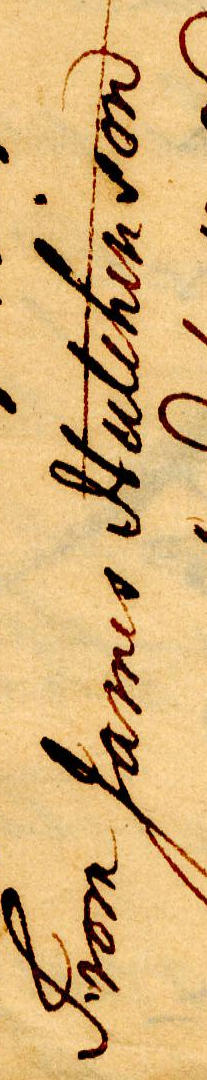From James Hutchinson
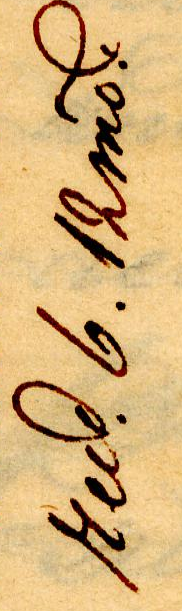rec^d. 6. 12 mo.
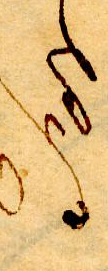For
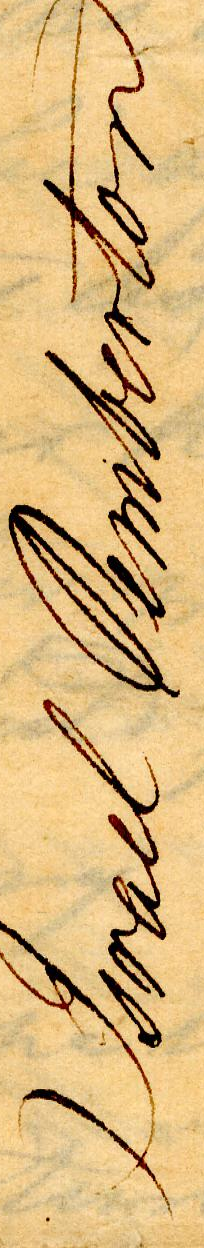Israel Pemberton
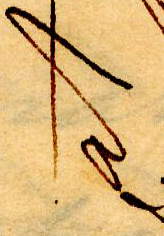at
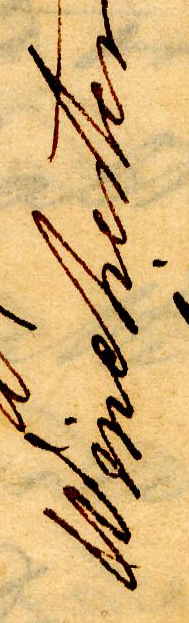Winchester
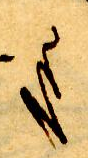in
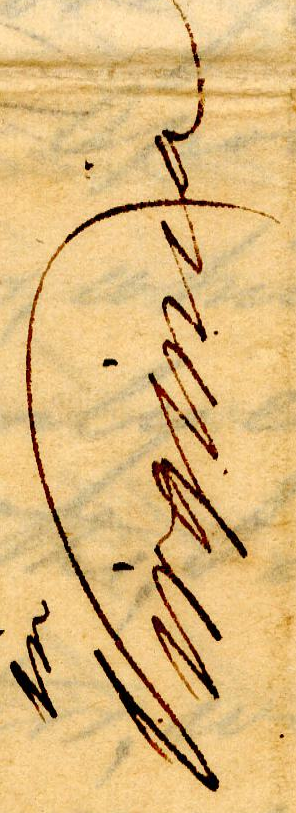Virginia
